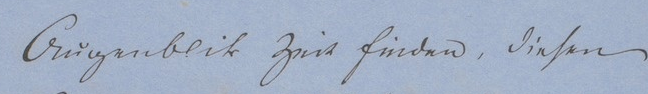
Augenblik Zeit finden, diesen
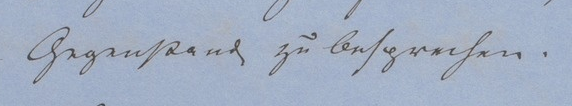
Gegenstand zu besprechen.
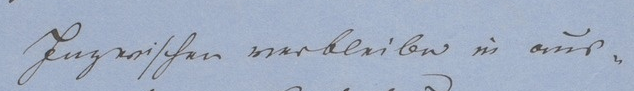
Inzwischen verbleibe in aus-
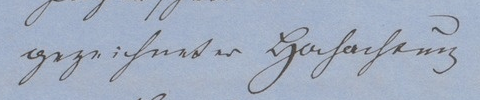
gezeichneter Hochachtung
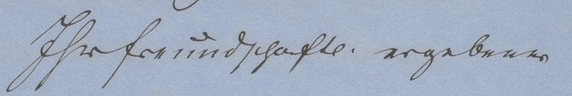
Ihr freundschaftl. ergebener
